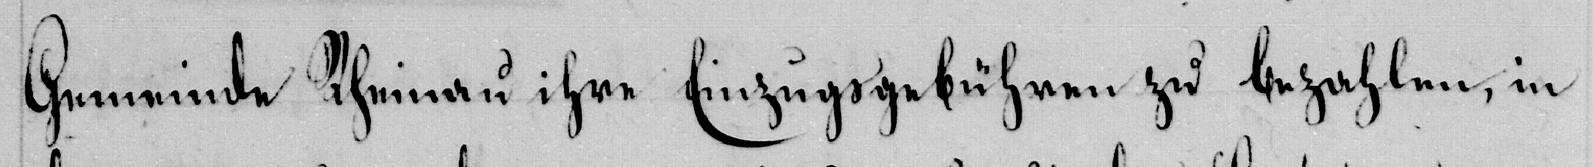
Gemeinde Rheinau ihre Einzugsgebühren zu bezahlen, in
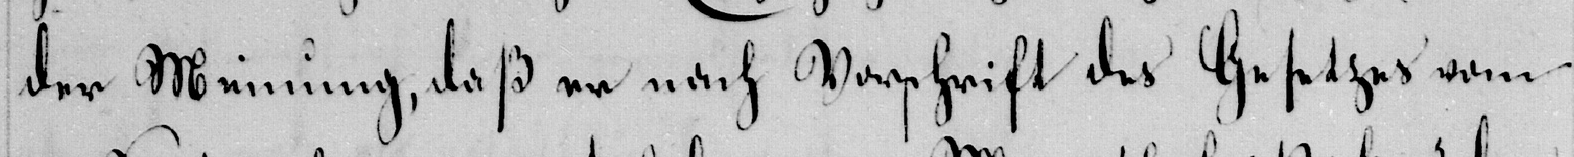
der Meinung, daß er nach Vorschrift des Gesetzes vom
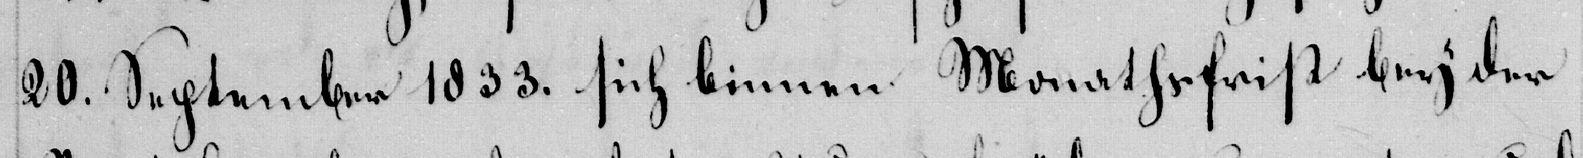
20. September 1833. sich binnen Monathsfrist bey der
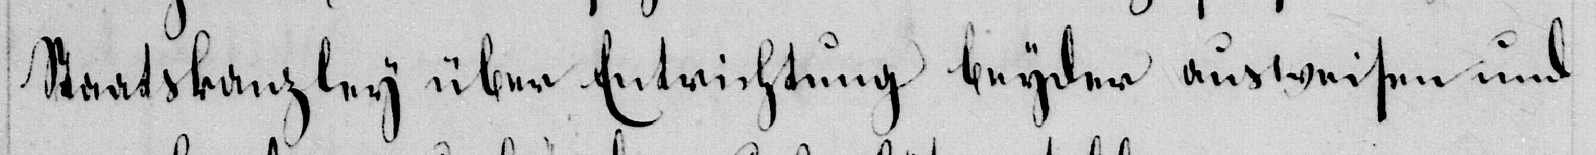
Staatskanzley über Entrichtung beyder ausweisen und
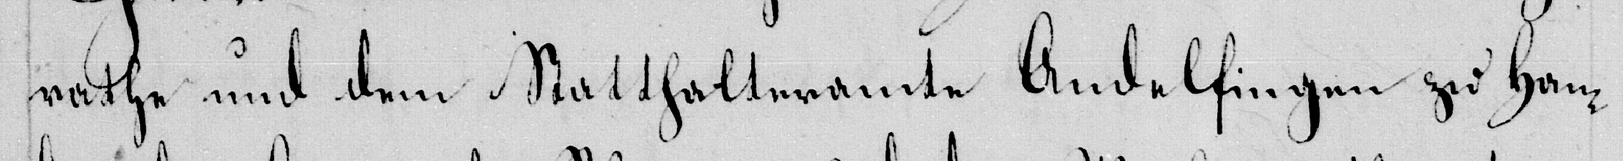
rathe und dem Statthalteramte Andelfingen zu Han¬
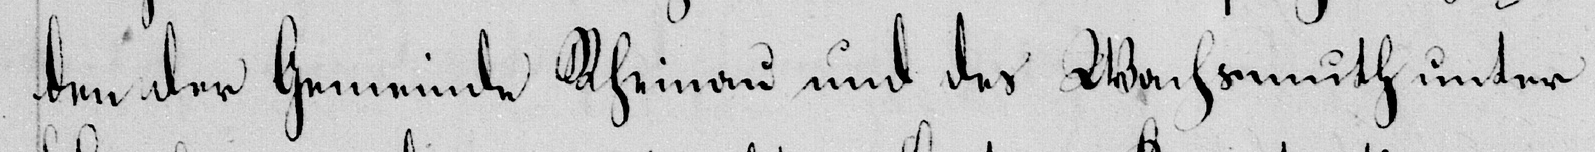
den der Gemeinde Rheinau und des Wachsmuth unter
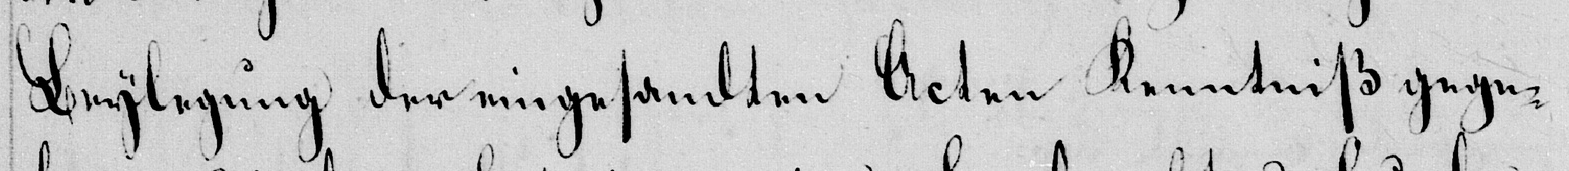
Beylegung der eingesandten Acten Kenntniß gege¬
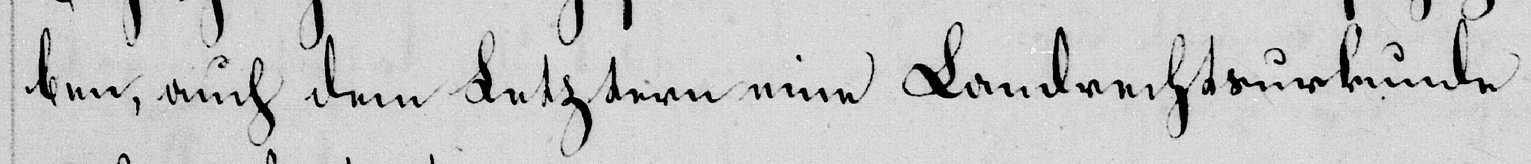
ben, auch dem Letztern eine Landrechtsurkunde
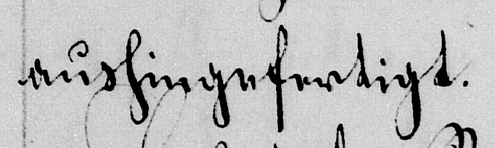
aushingefertigt.
